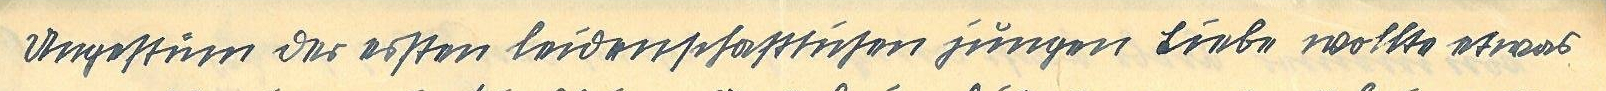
Ungestüm der ersten leidenschaftlichen jungen Liebe wollte etwas
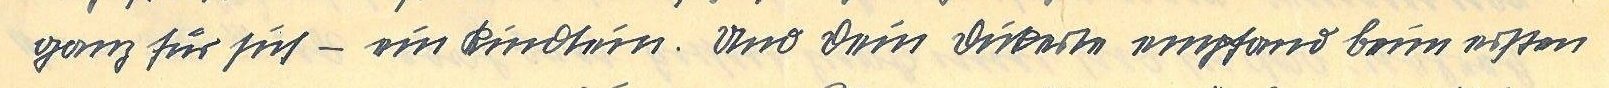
ganz für sich – ein Kindlein. Und Dein Dickerle empfand beim ersten
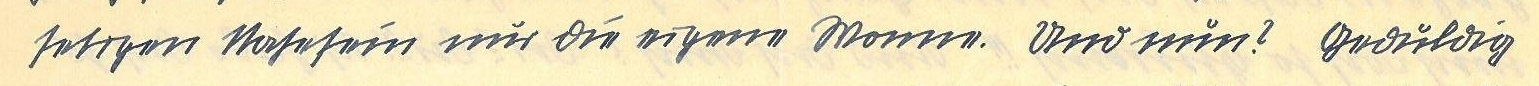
seligen Nahesein nur die eigene Wonne. Und nun? Geduldig
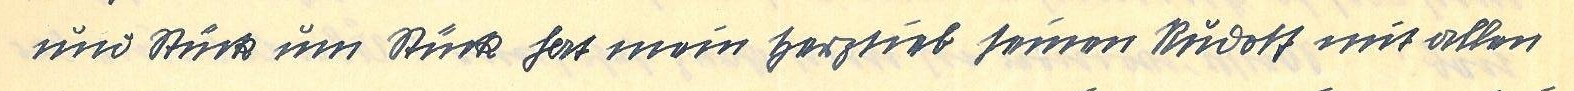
und Stück um Stück hat mein Herzlieb seinen mit allen
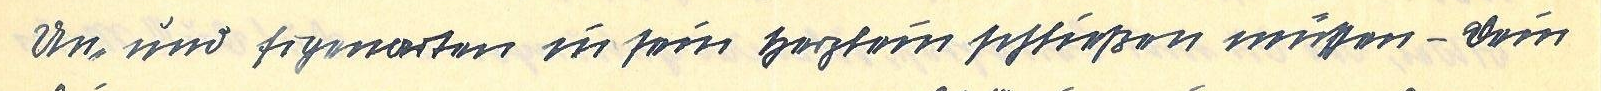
Un- und Eigenarten in sein Herzlein schließen müssen – Dein
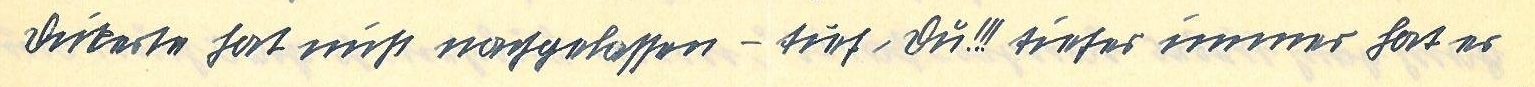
Dickerle hat nicht nachgelassen – tief, Du!!! tiefer immer hat er
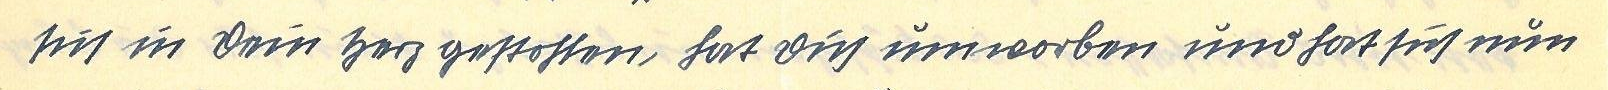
sich in Dein Herz gestohlen, hat Dich umworben und hat sich nun
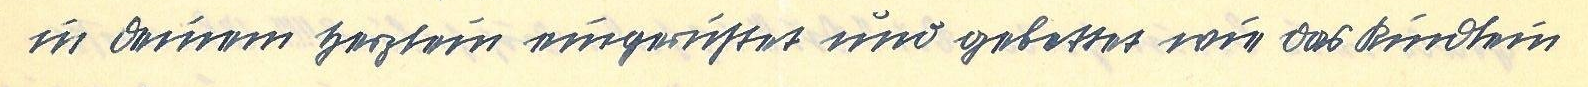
in Deinem Herzlein eingerichtet und gebettet wie das Kindlein
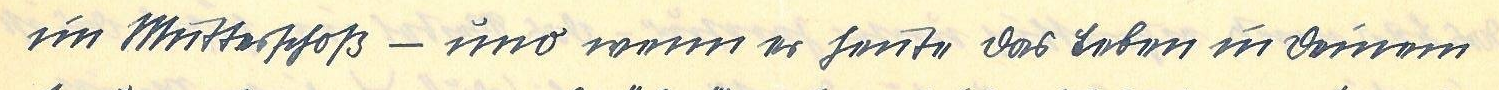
im Mutterschoß – und wenn er heute das Leben in Deinem
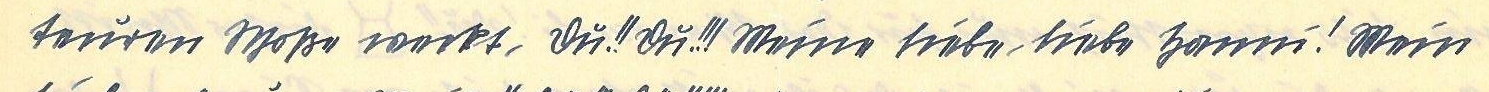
teuren Schoße weckt, Du!! Du!!! Meine liebe, liebe! Mein
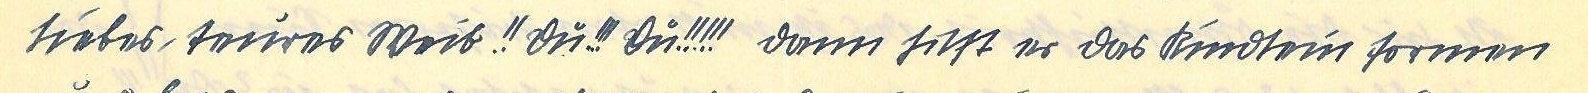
liebes, teures Weib!! Du!! Du!!!!! dann hilft er das Kindlein formen
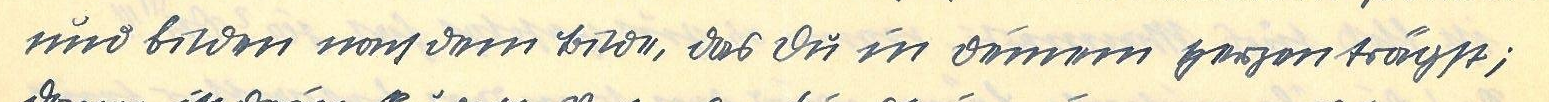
und bilden nach dem Bilde, das Du in Deinem Herzen trägst;
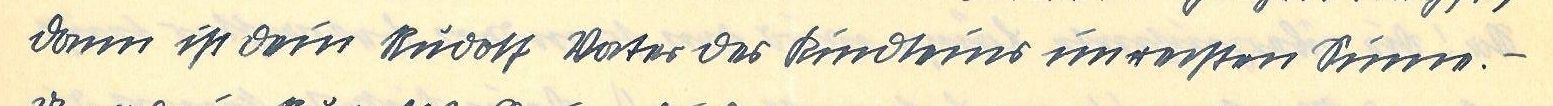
dann ist Dein Vater des Kindleins im rechten Sinne. –
